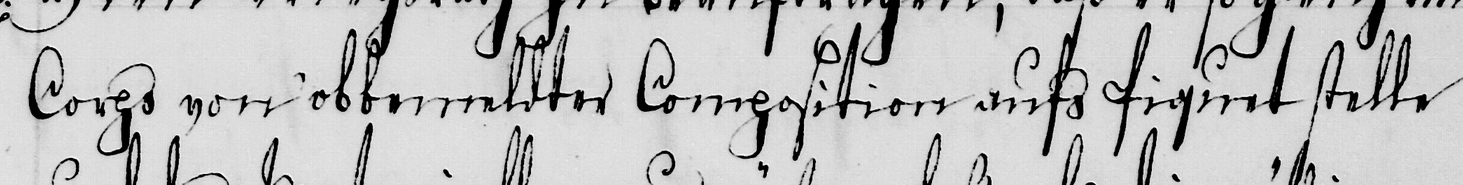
Corps von obbemeldter Composition aufs Piquet stelle
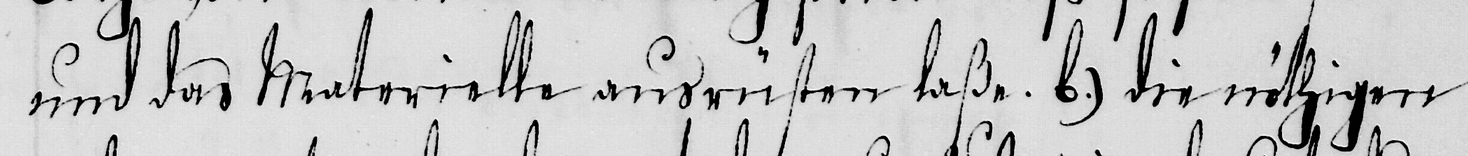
und das Materielle ausrüsten laße. b.) die nöthigen
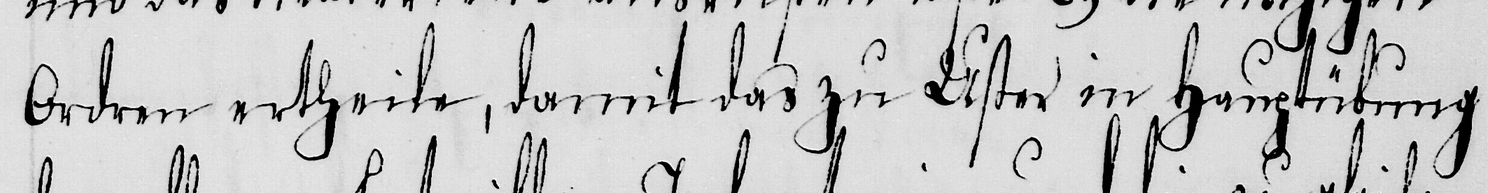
Ordren ertheile, damit das zu Uster in Hauptübung
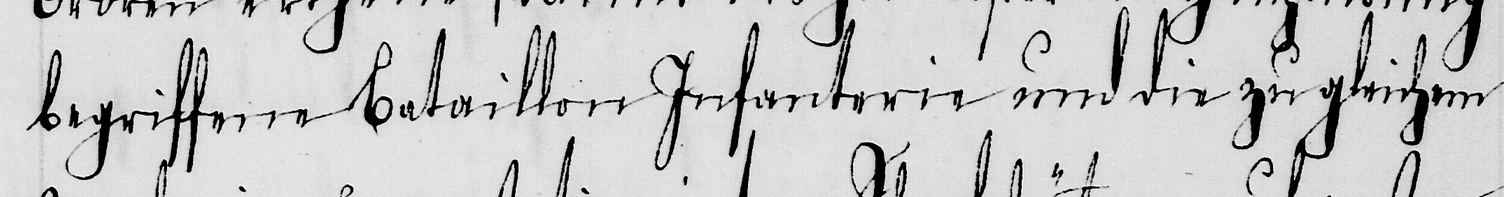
begriffene Bataillon Infanterie und die zu gleichem
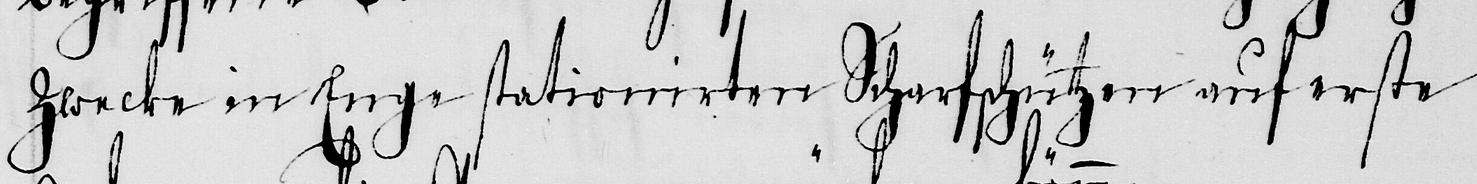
Zwecke in Enge stationirten Scharfschützen auf erste
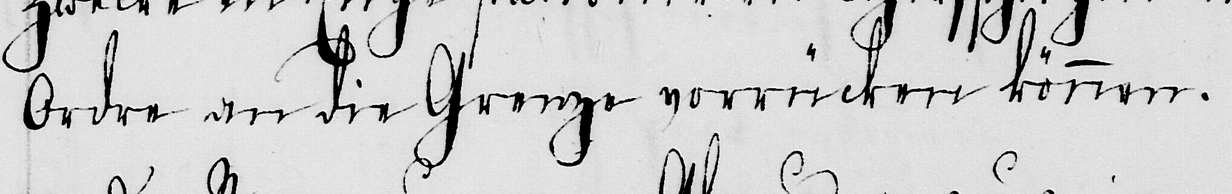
Ordre an die Grenze vorrücken können.
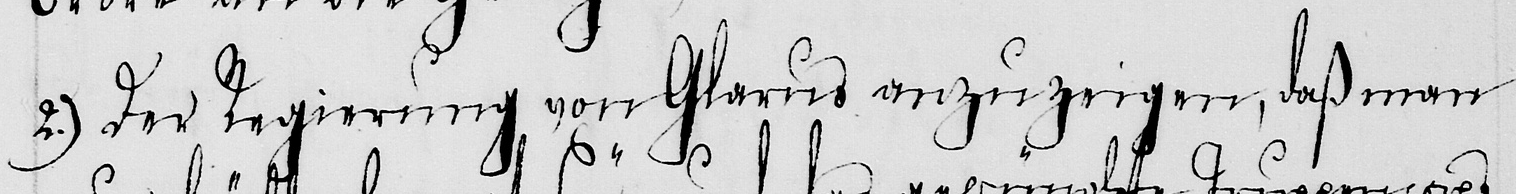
2.) Der Regierung von Glarus anzuzeigen, daß man
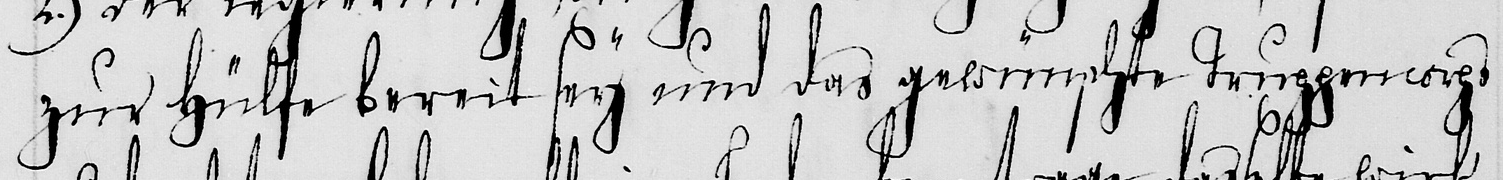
zur Hülfe bereit sey und das gewünschte Truppencorps
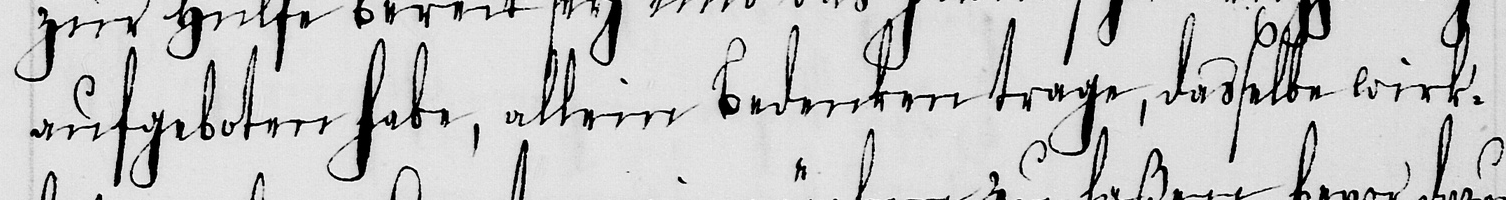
aufgeboten habe, allein Bedenken trage, dasselbe wirk¬
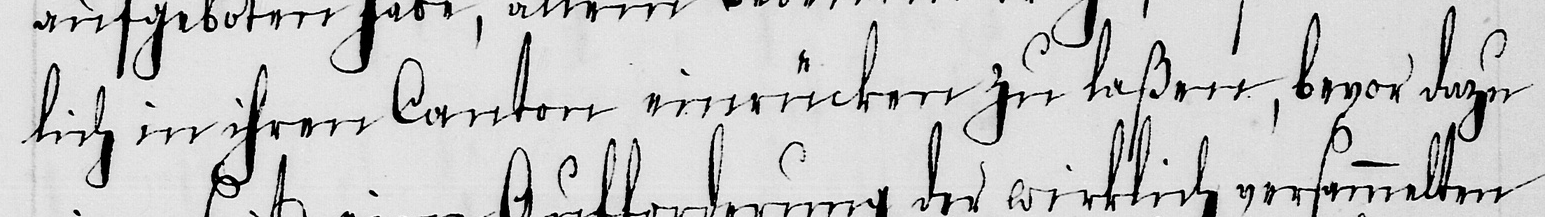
lich in ihren Canton einrücken zu laßen, bevor dazu
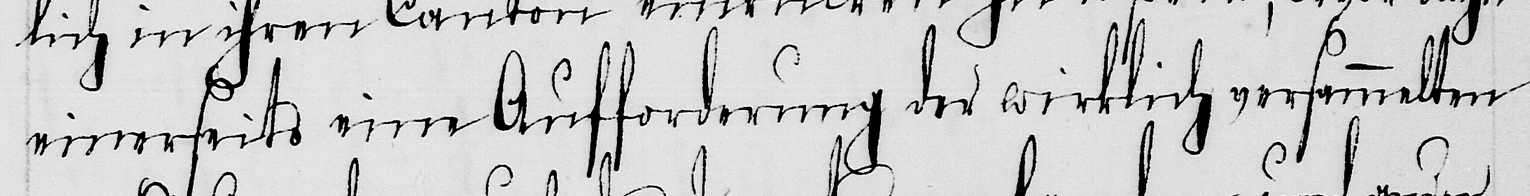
einerseits eine Aufforderung der wirklich versammelten
